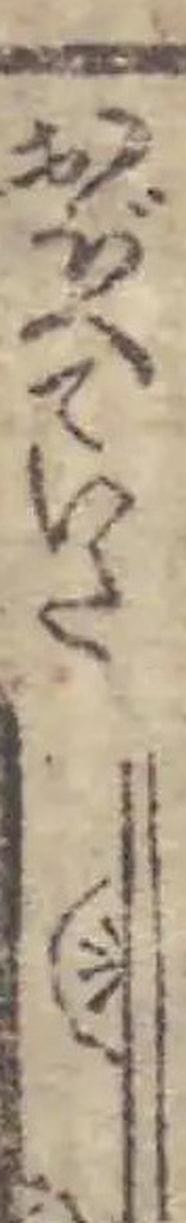おぼへていた
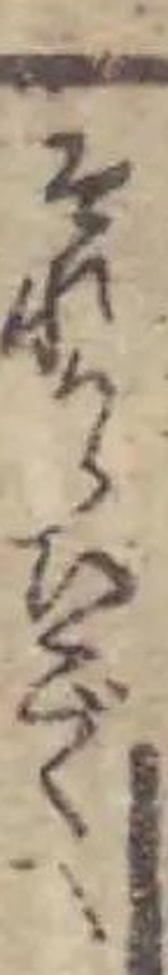それからちごくへ
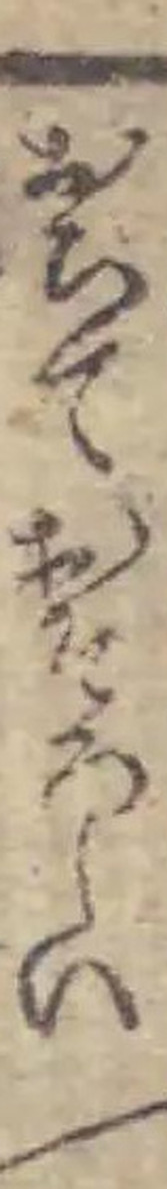おちておそろしい
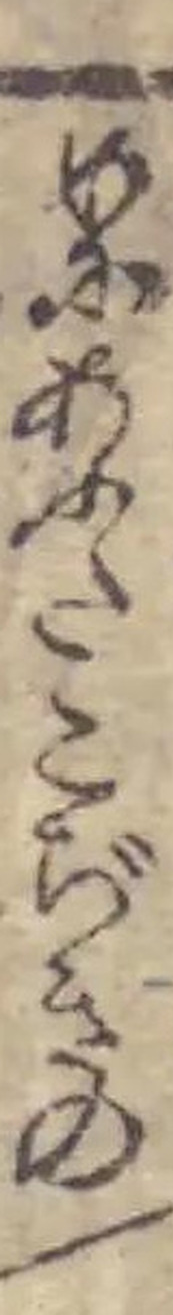めにあふたこぢきの
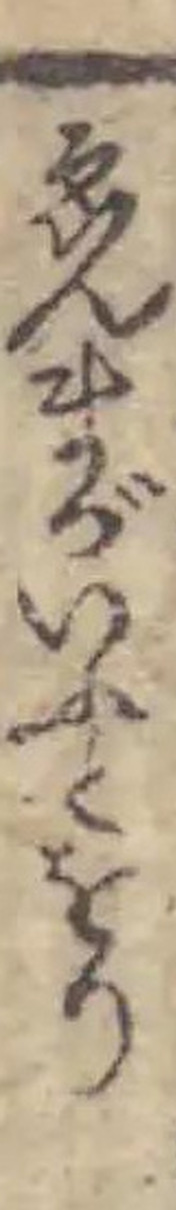ゑんまがいふとをり
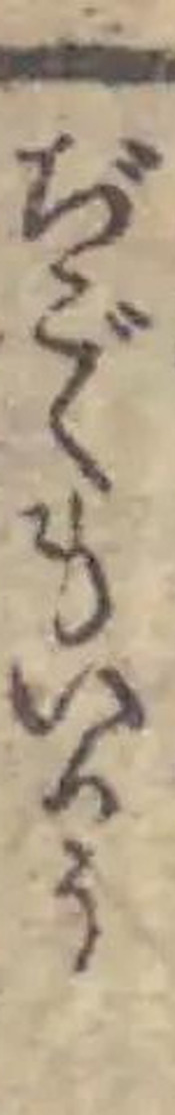ぢごくもいう
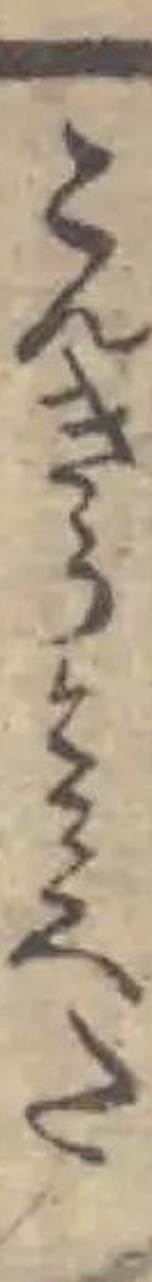こんきうとみへた
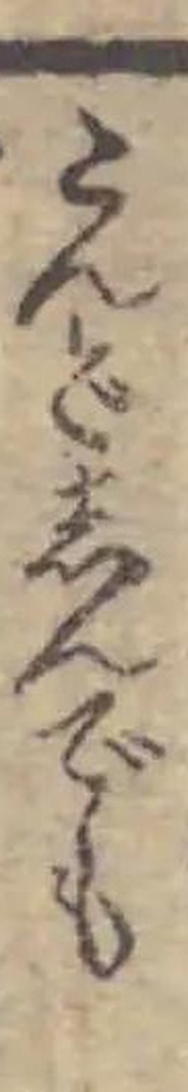こんどしんでも
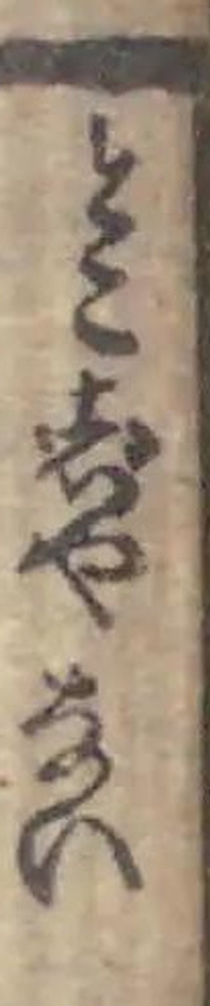とこじやない
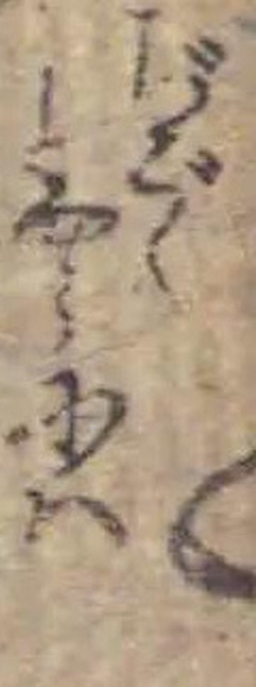とやらには
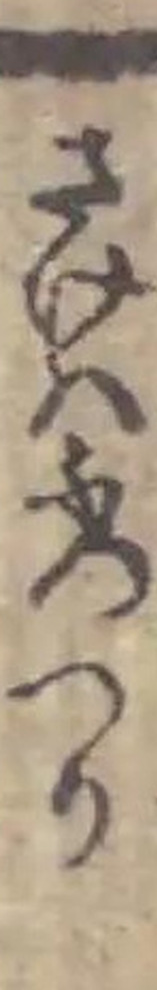さけはふつつり
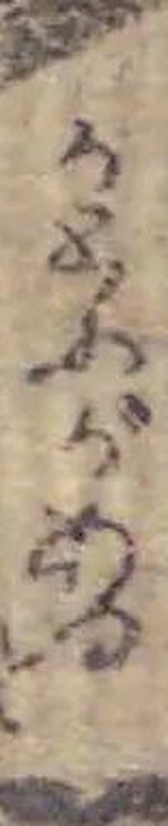かとふがあると
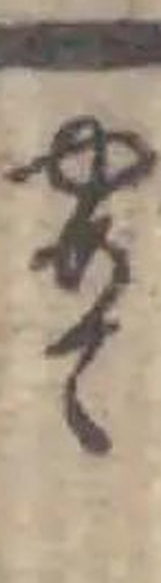やめて
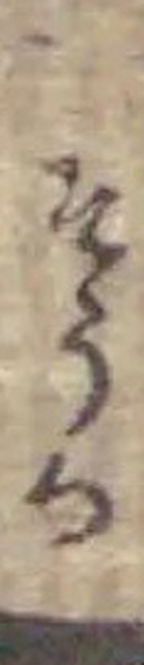そうか
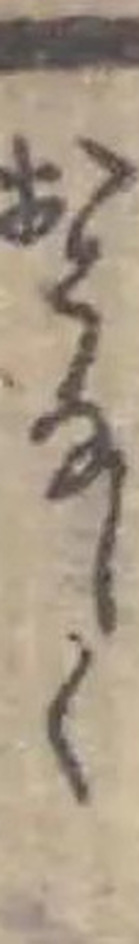おとなしく
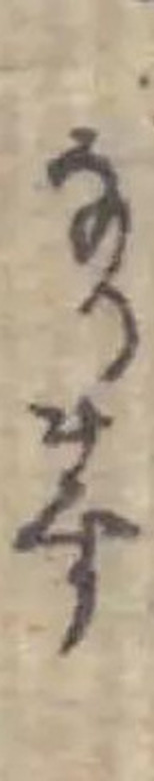なります
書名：飲中八人前 3巻
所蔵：国立国会図書館 National Diet Library, JAPAN
